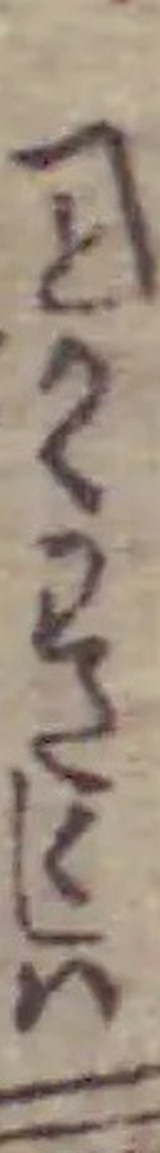〽とかくわたくしは
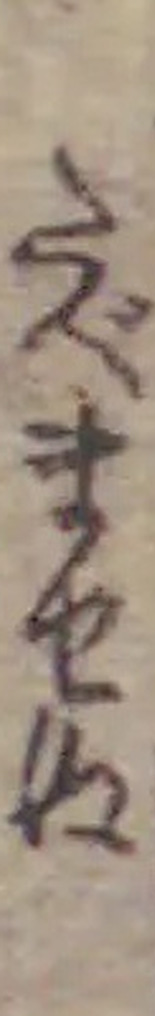たべませぬ
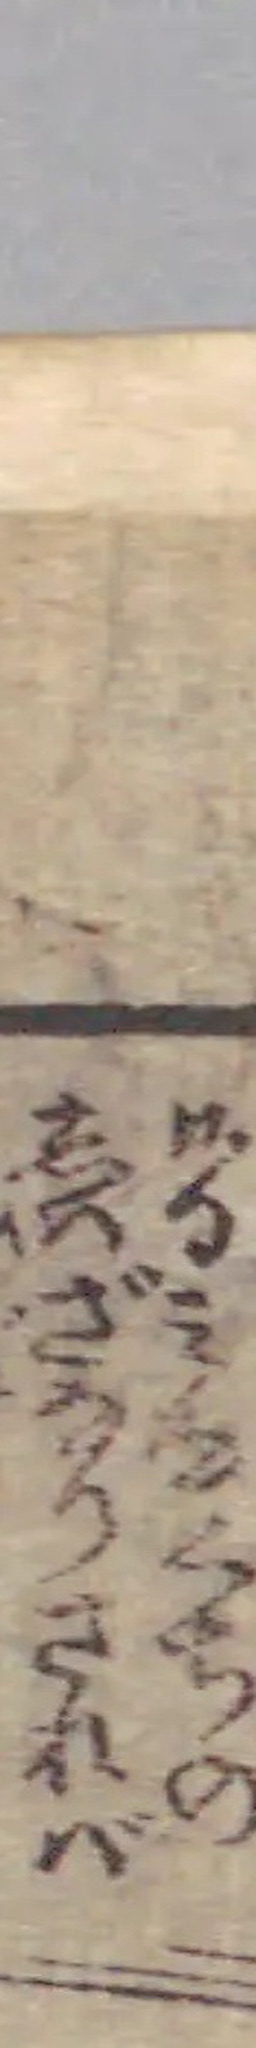しはざなりされば
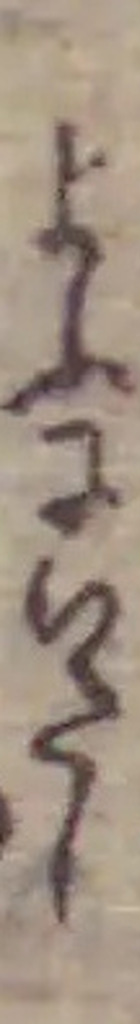よふにいたし
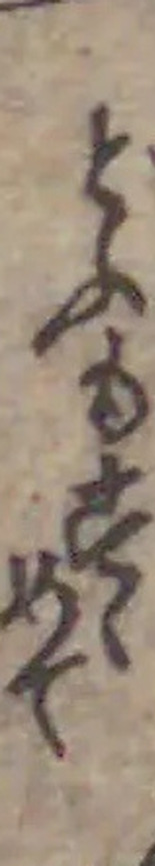どふもすゝ
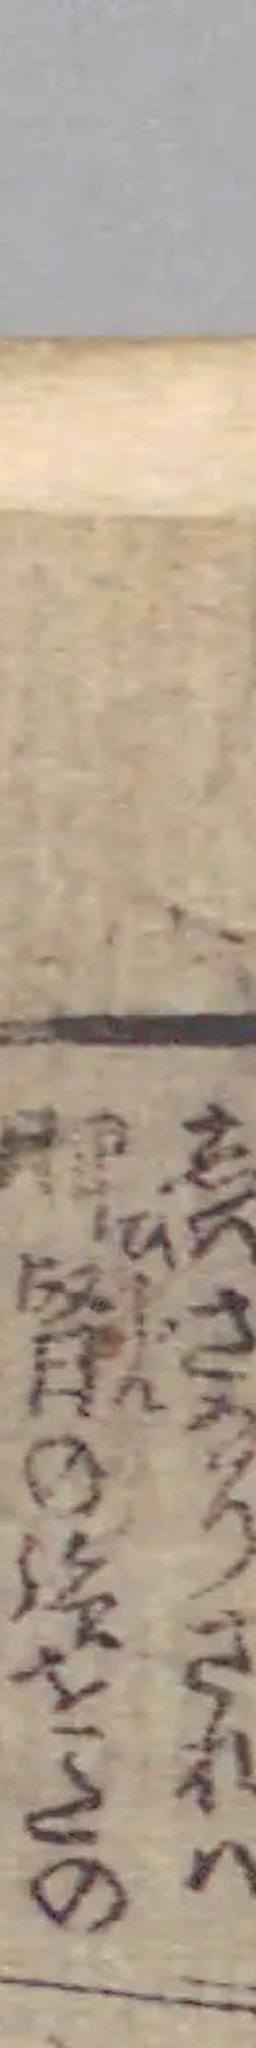脾腎のをたの
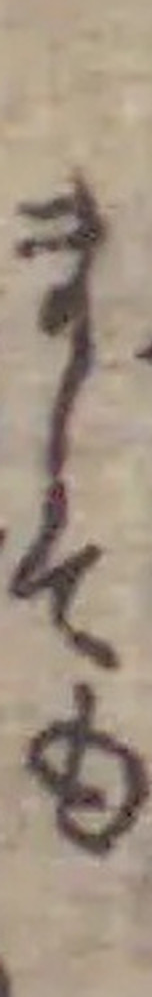ましても
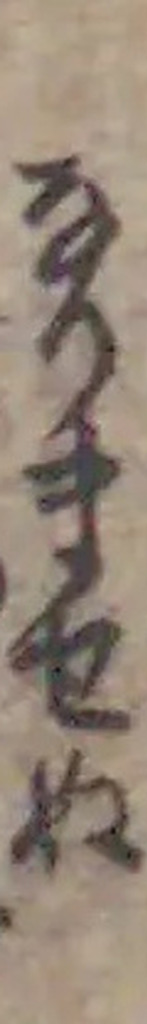なりませぬ
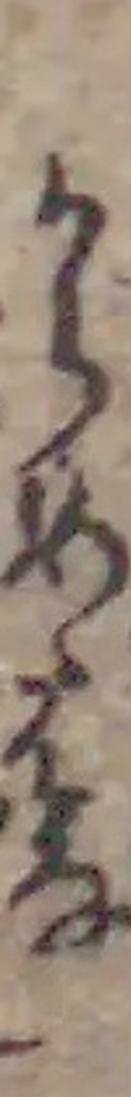からめはな
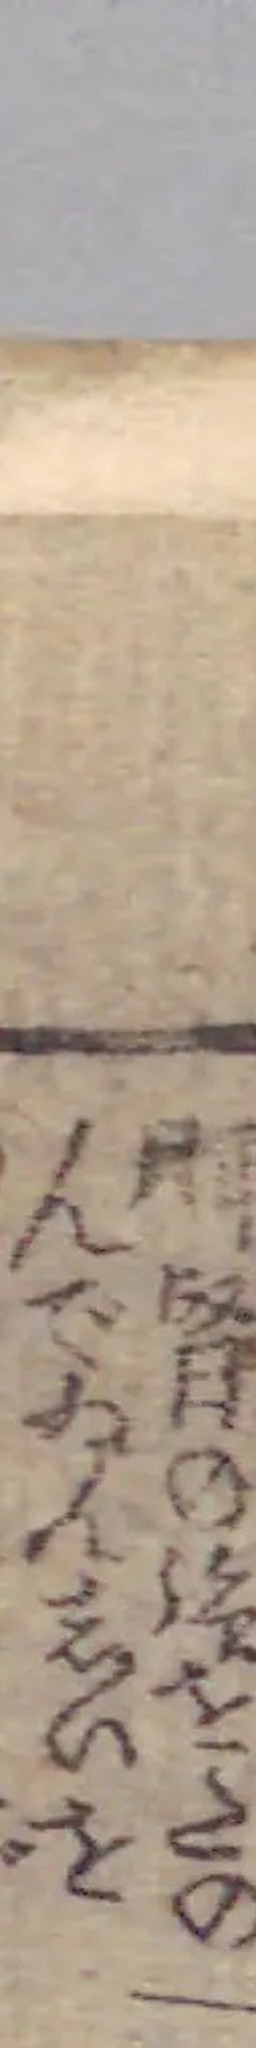んでゐんしいを
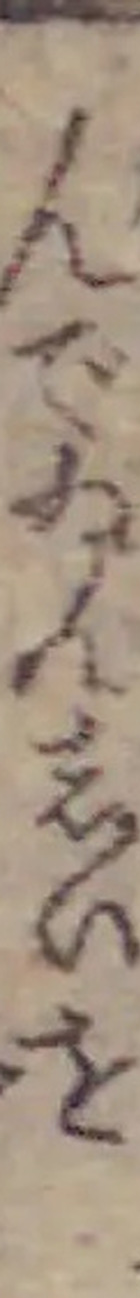んでゐんしいを
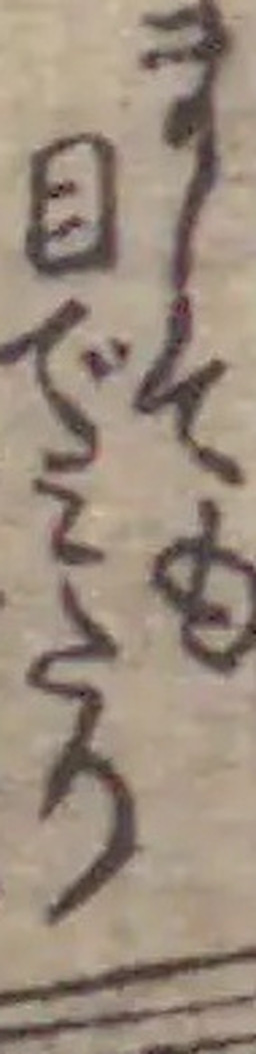目でみたり
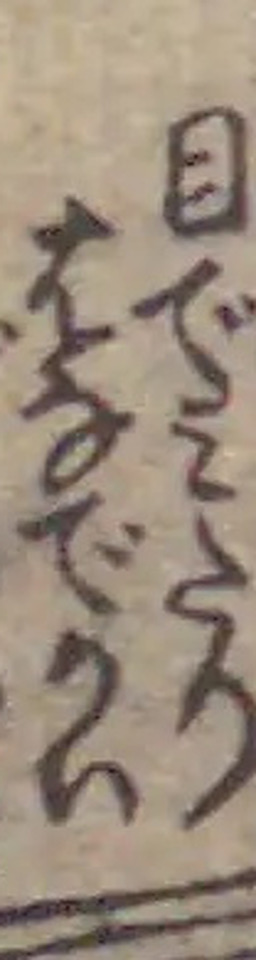はなでかい
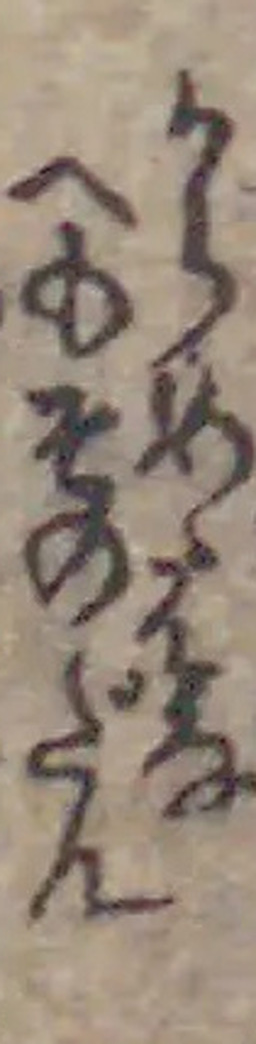へもそのだん
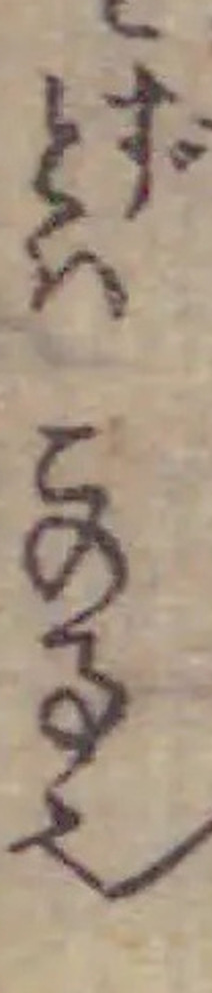とはこの事也
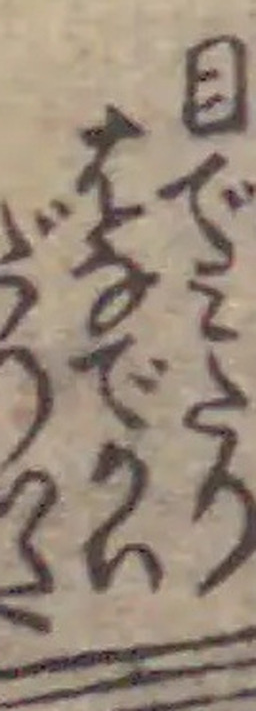だりいた
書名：腹内養生主論 3巻
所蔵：国立国会図書館 National Diet Library, JAPAN
